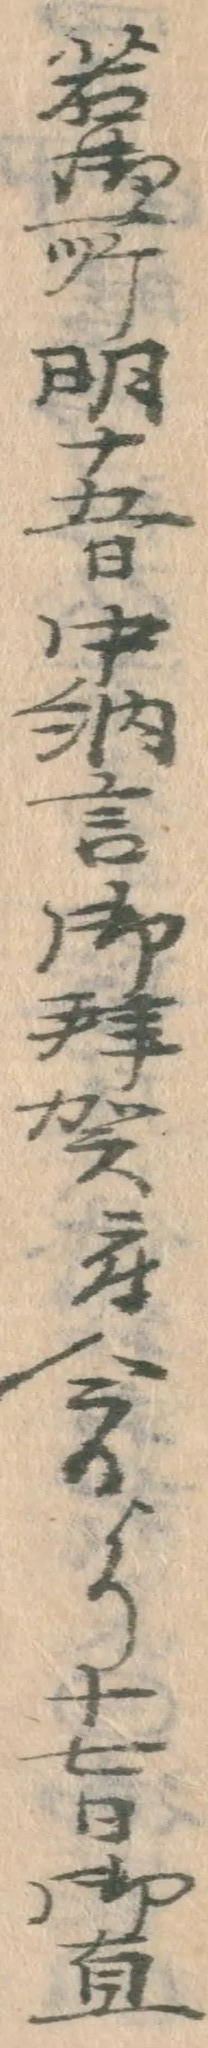若御所明十五日中納言御拝賀ニ付今日より十七日御直
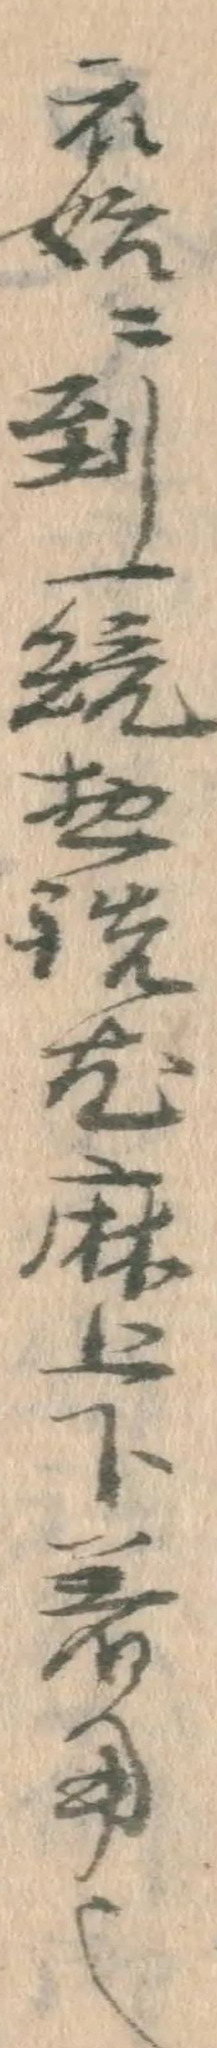衣始ニ到一統惣詰尤麻上下着用也
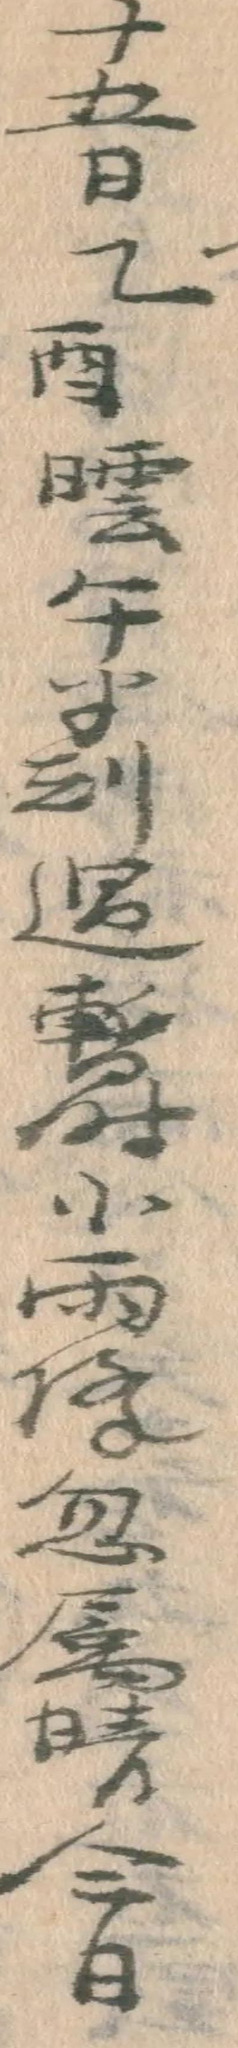十五日乙酉曇午半刻過暫時小雨降忽属晴今日
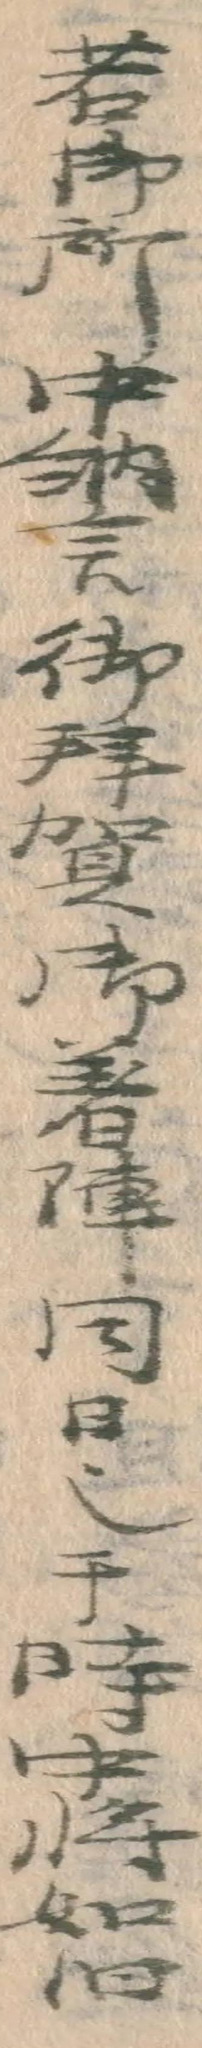若御所中納言御拝賀御着陣同日也于時中将如旧
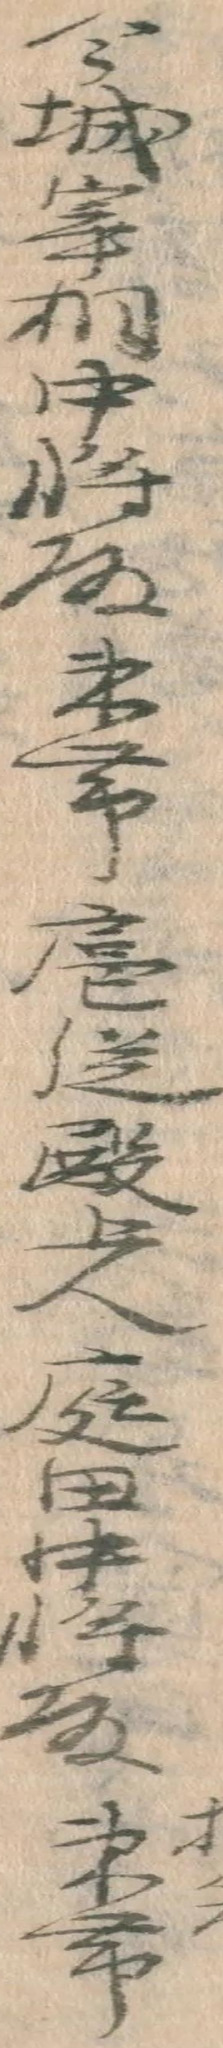今城宰相中将殿束帯扈従殿上人庭田中将殿束帯
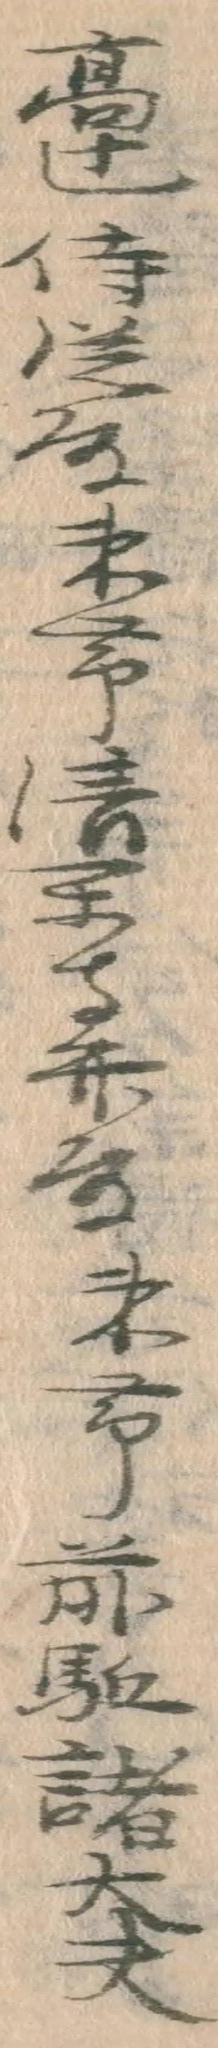高辻侍従殿束帯清閑寺弁殿束帯前駆諸大夫
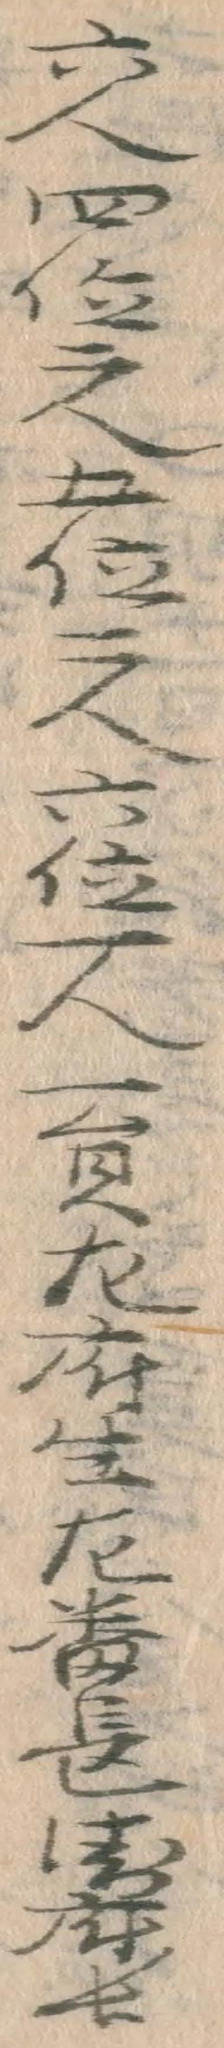六人四位二人五位二人六位一人一員左府生左番長衛門尉長
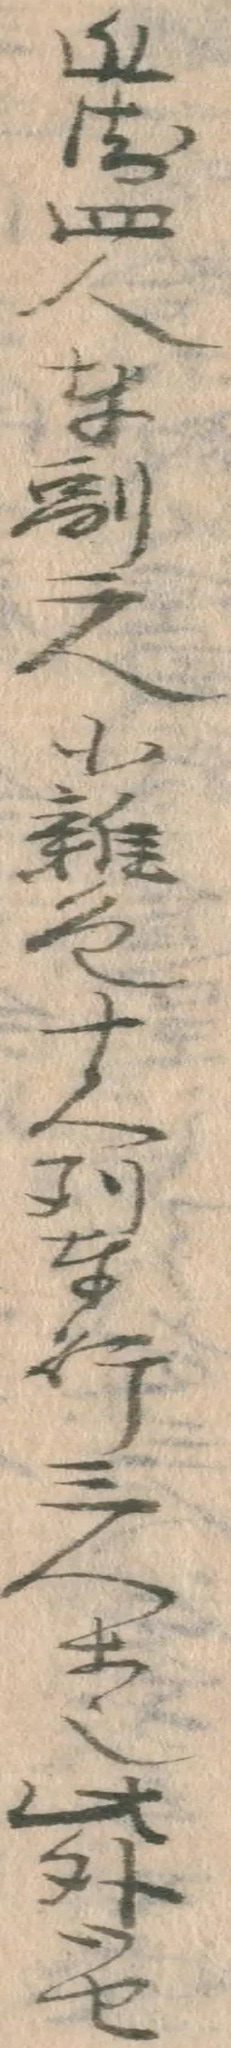近衛四人奉副二人小雑色十人列奉行三人等也此外御セ
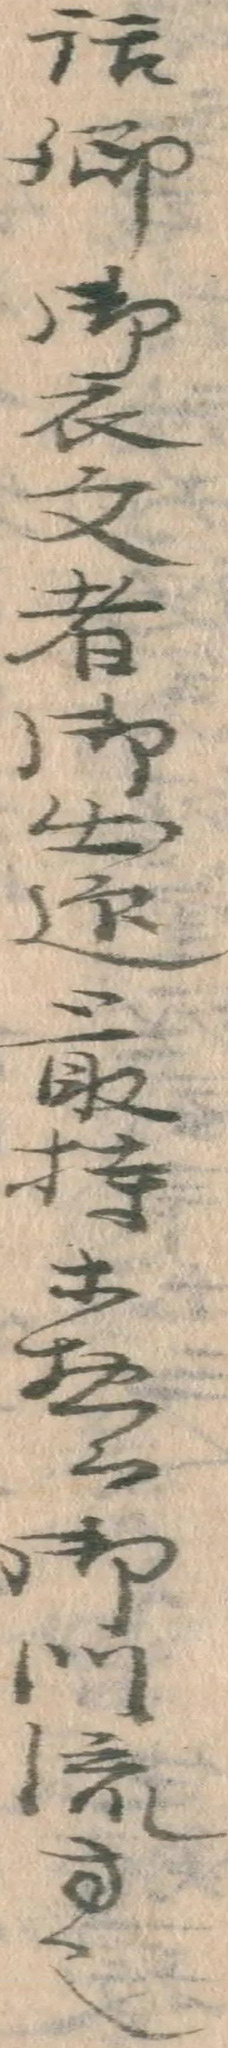詰卿御衣文者御出迎御持等惣而御門流方也
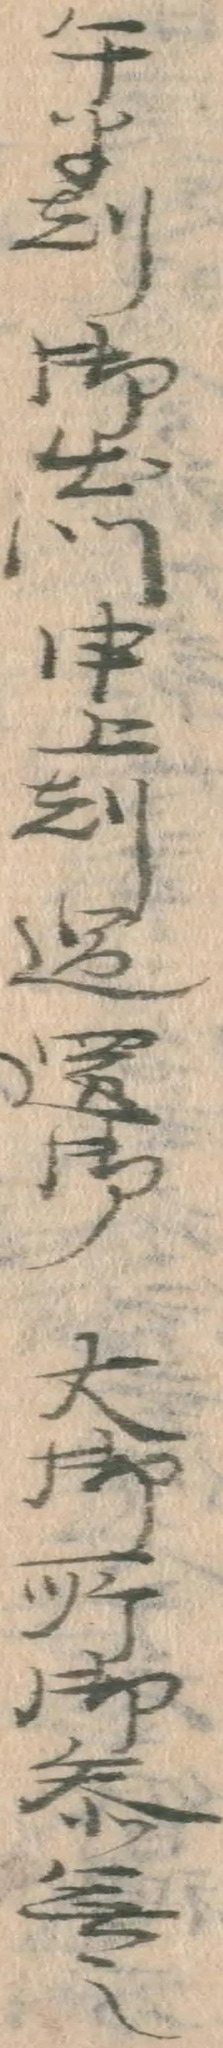午半刻御出門申上刻過還御大御所御参無之
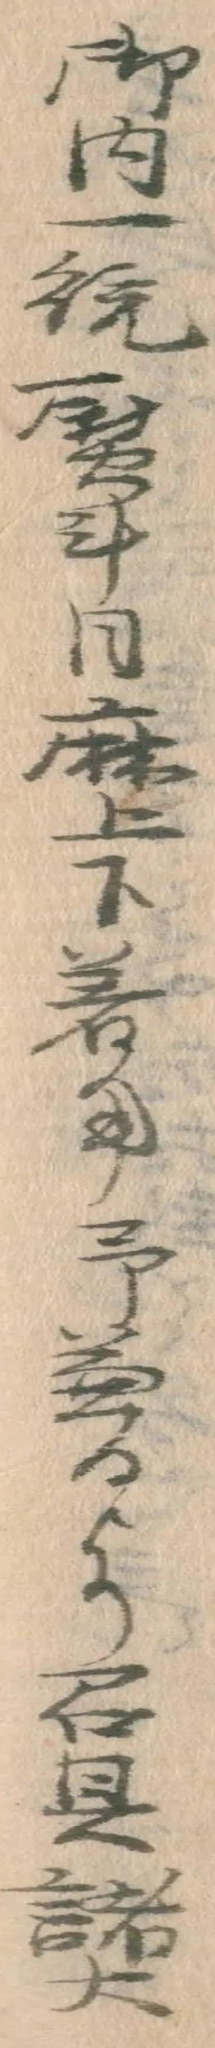御内一統熨斗目麻上下着用予兼而より召具諸大
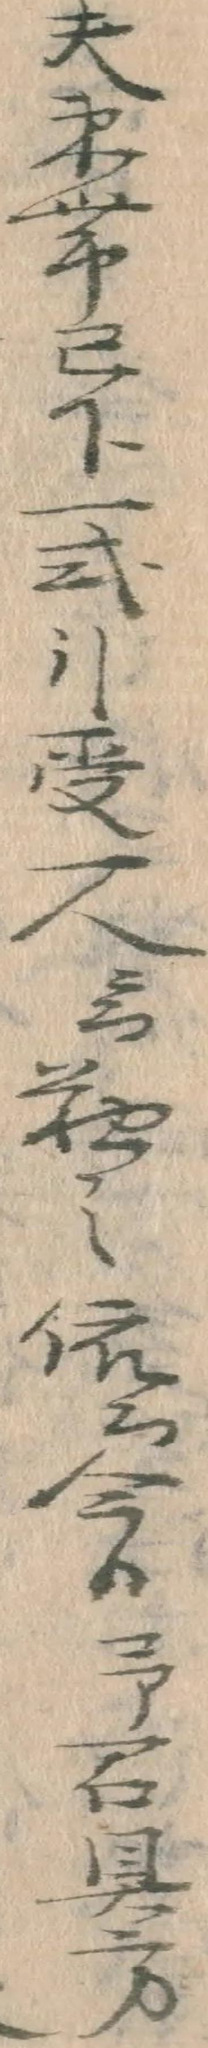夫束帯已下一式引受一人ニ而勤之依而今日予召具方
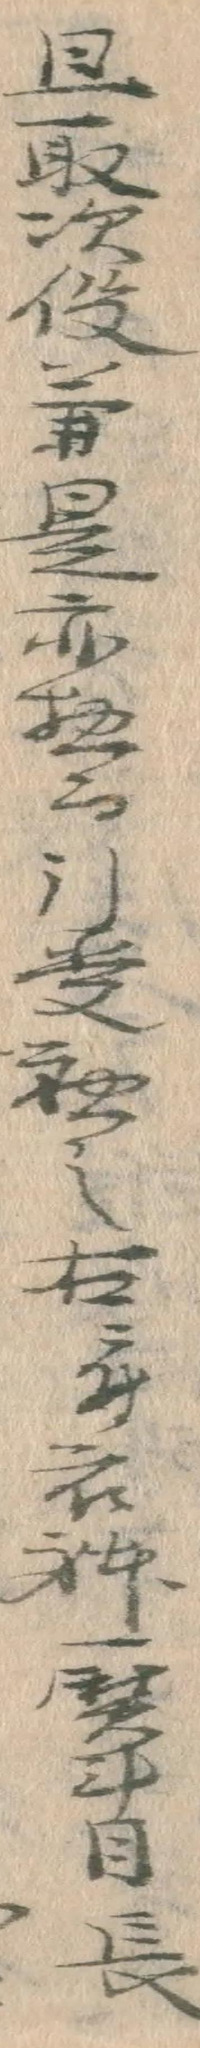且取次役兼是亦惣而引受勤之右ニ付衣躰熨斗目長
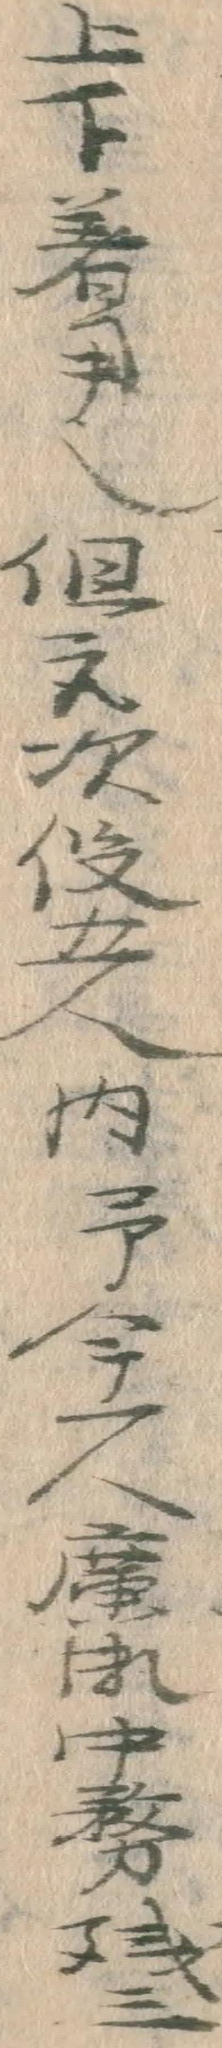上下着用也但取次役五人内予今一人廣瀬中務残三
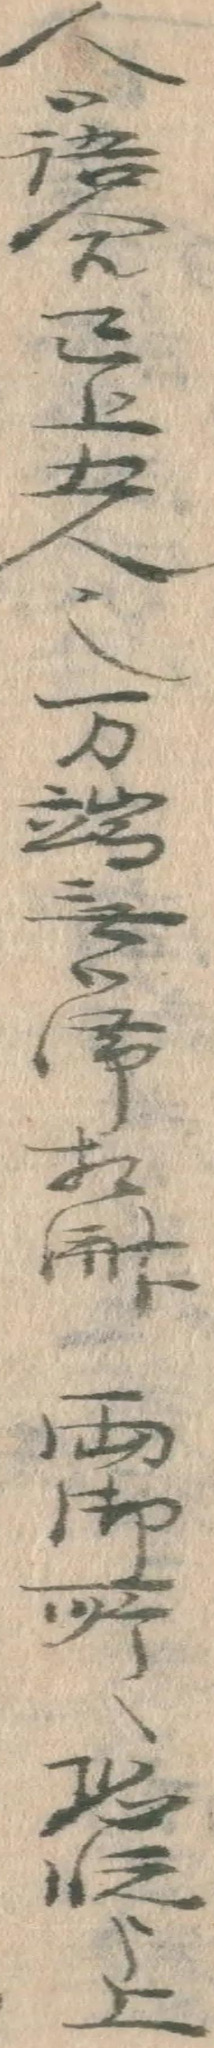人御語合已上五人也万端無御滞相済両御所へ恐悦申上
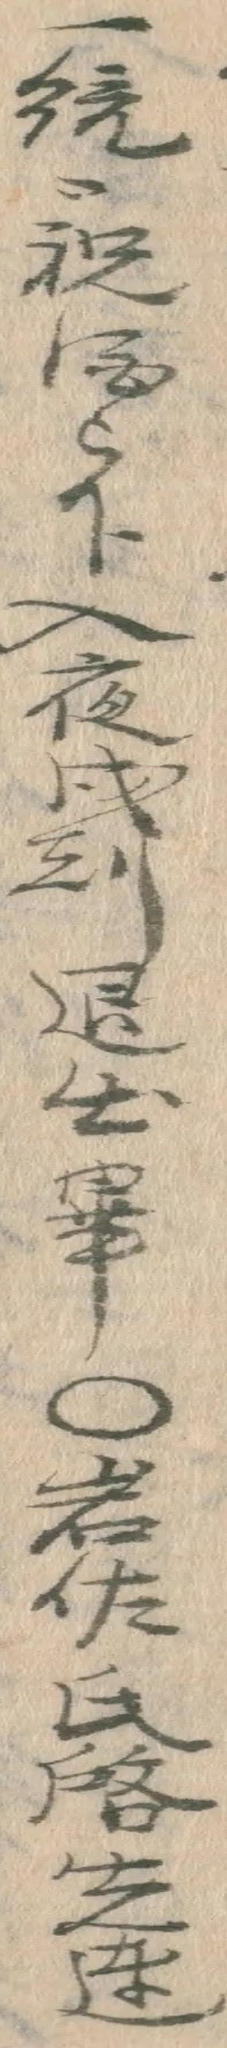一統御祝儀被下入夜戌刻退出畢○岩佐氏啓先達
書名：賀茂社記録. 第63冊
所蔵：国立国会図書館 National Diet Library, JAPAN
